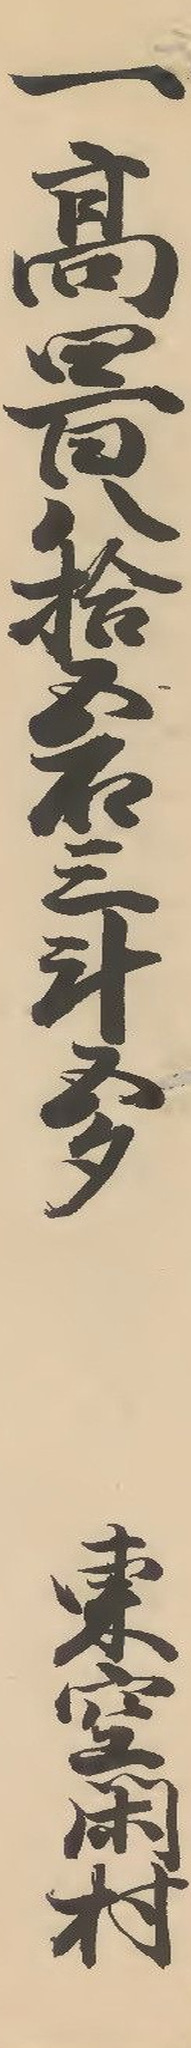一髙四百八拾五石三斗五夕東空閑村
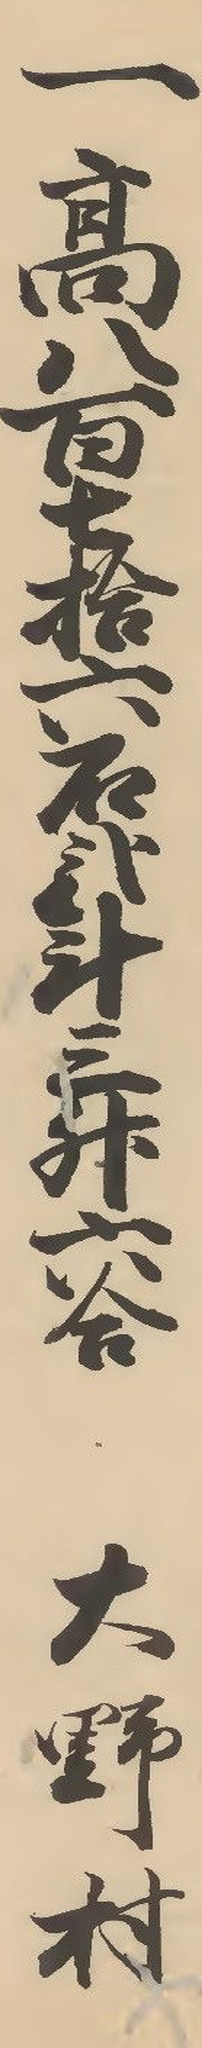一髙八百七拾六石弐斗三升六合大野村
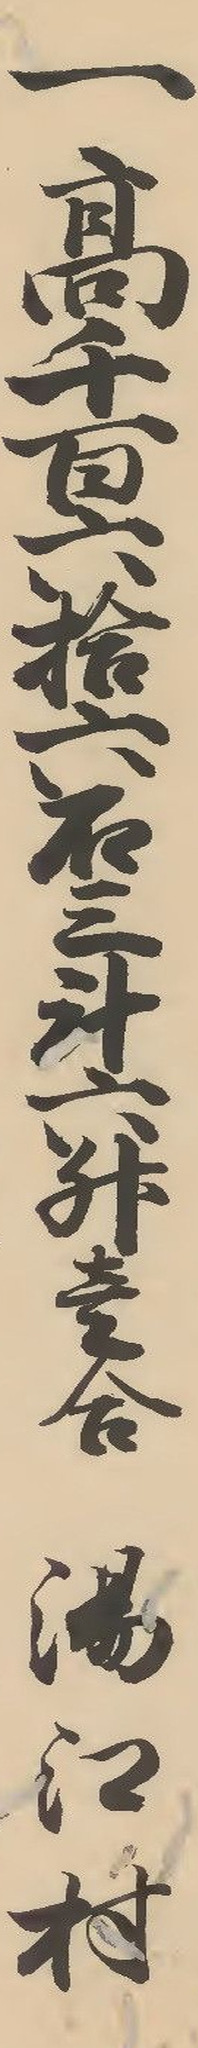一髙千百六拾六石三斗六升壱合湯江村
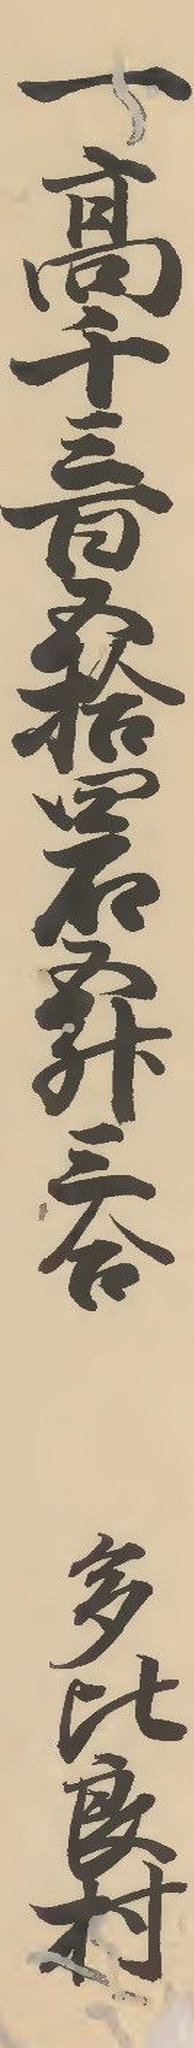一髙千三百五拾四石五升三合多比良村
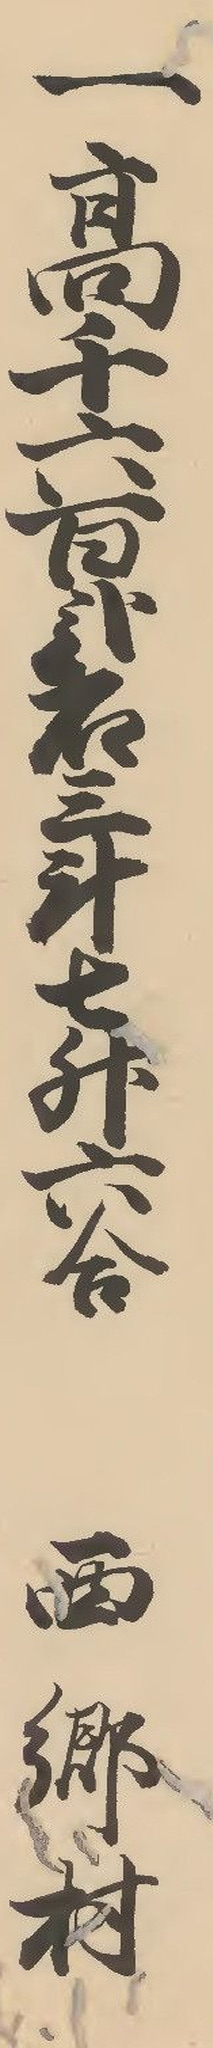一髙千六百弐石三斗七升六合西郷村
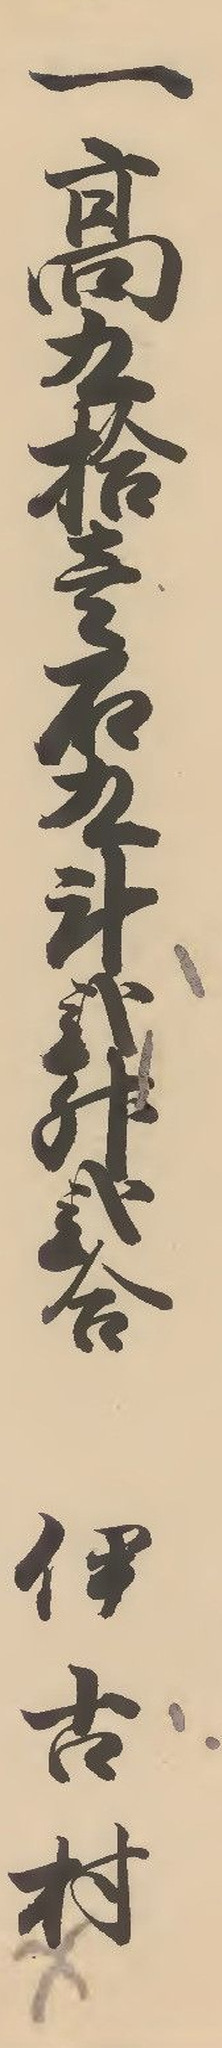一髙九拾壱石九斗弐升弐合伊古村
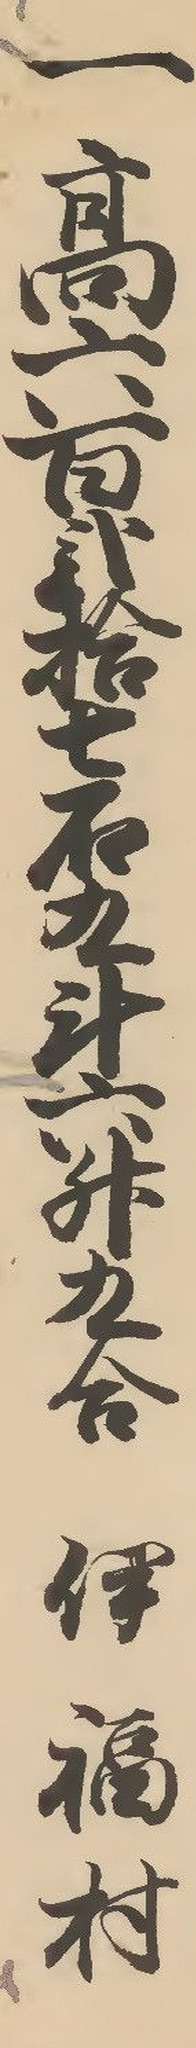一髙六百弐拾七石九斗六升九合伊福村

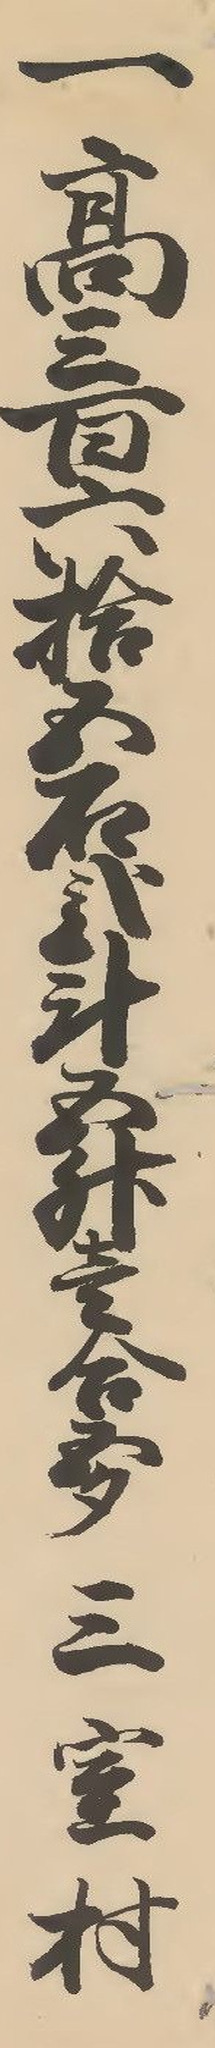一髙三百六拾五石弐斗五升壱合五夕三室村
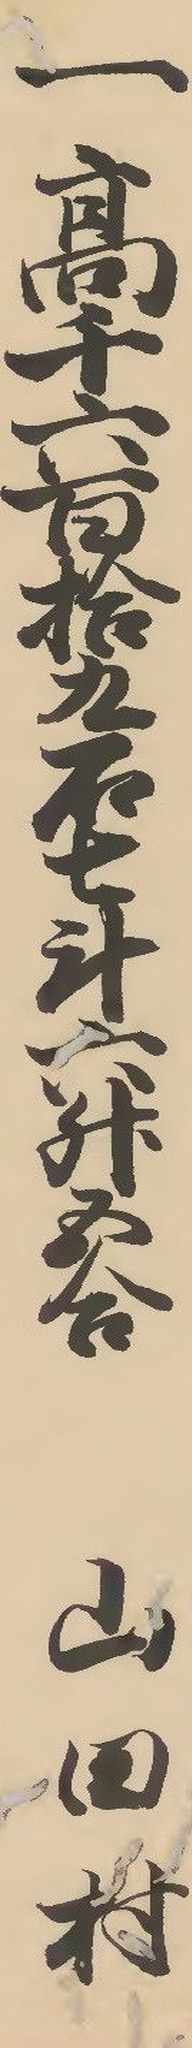一髙千六百拾九石七斗六升五合山田村
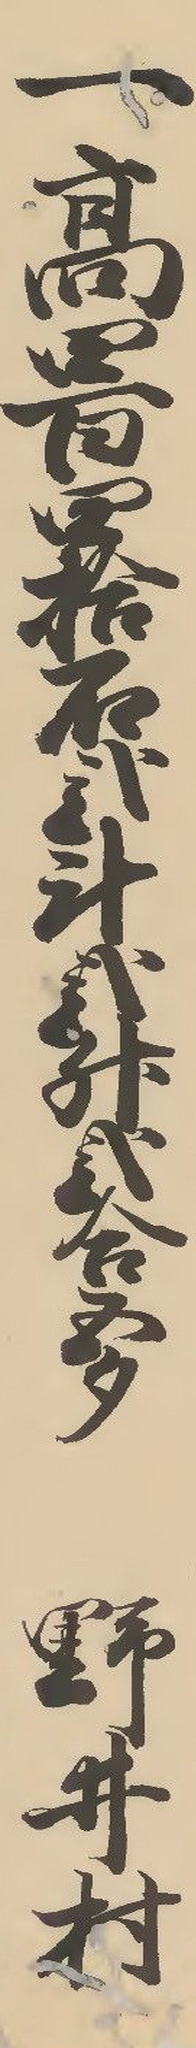一髙四百四拾石弐斗弐升弐合五夕野井村
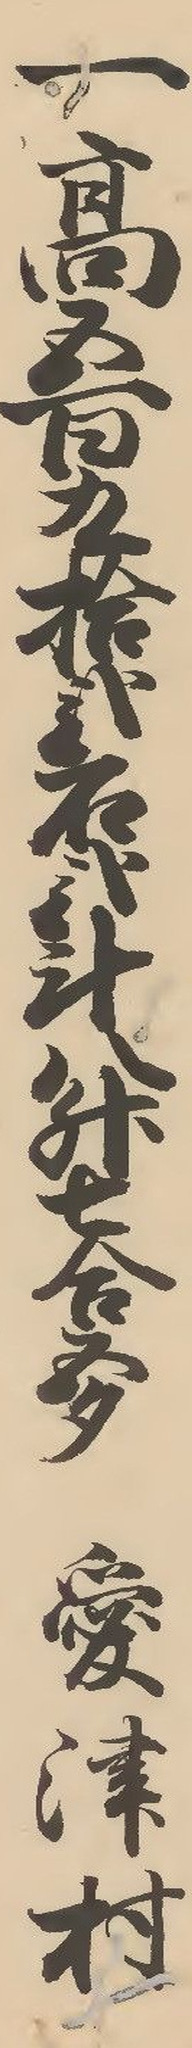一髙五百九拾弐石弐斗八升七合五夕愛津村
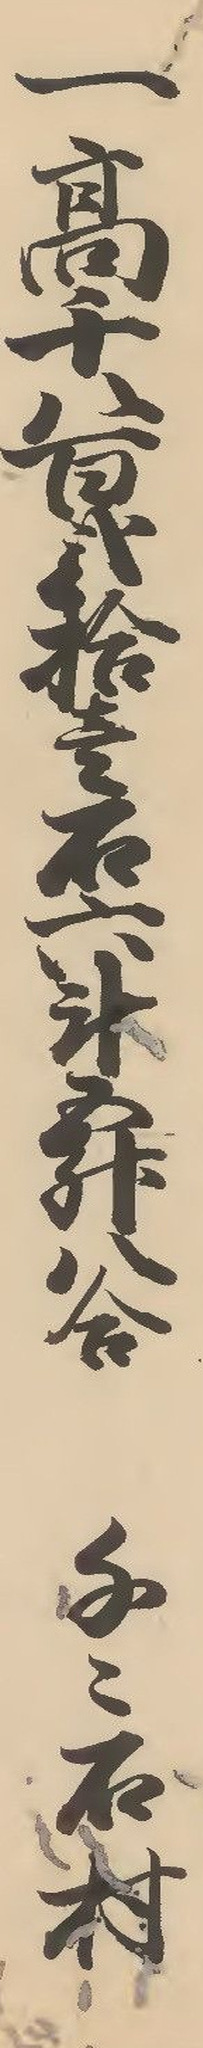一髙千八百弐拾壱石六斗五升八合千々石村
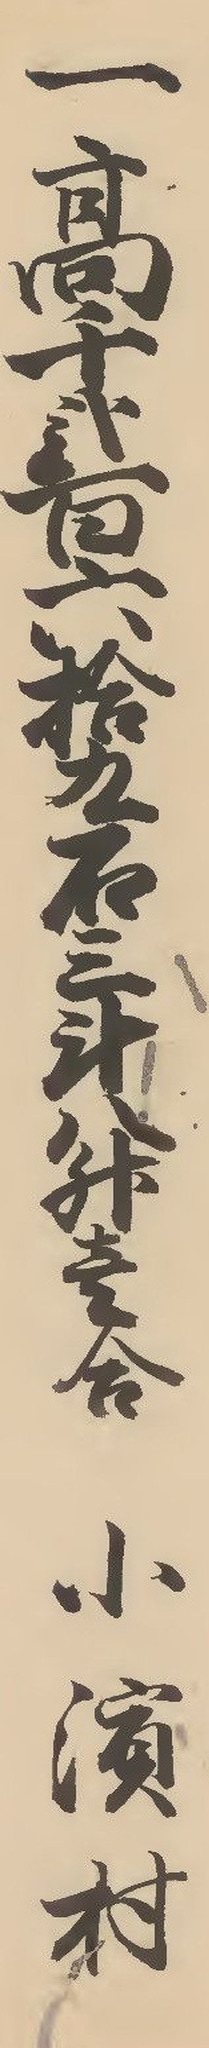一髙千弐百六拾九石三斗八升壱合小濱村
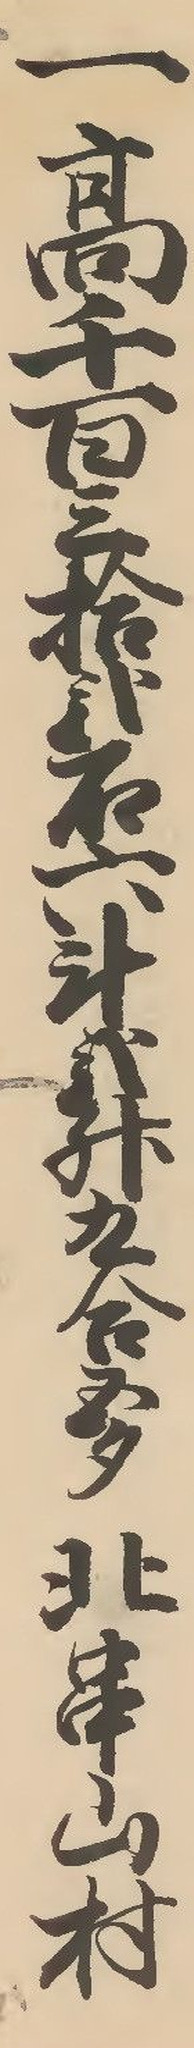一髙千百三拾弐石六斗弐升九合五夕北串山村

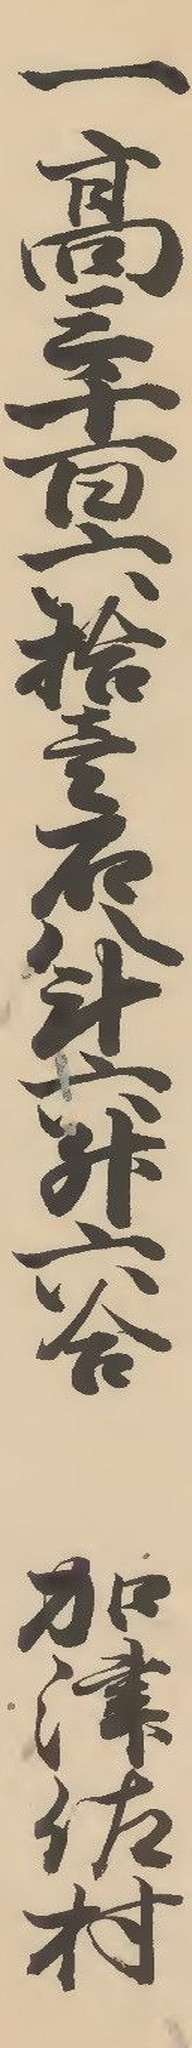一髙三千百六拾壱石八斗六升六合加津佐村
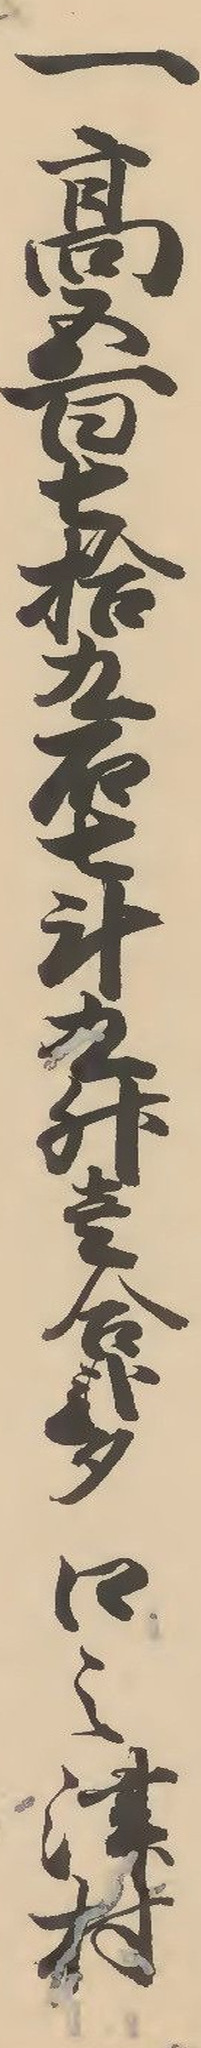一髙五百七拾九石七斗九升壱合弐夕口之津村
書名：肥前国郷帳
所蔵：国立公文書館 National Archives of Japan
